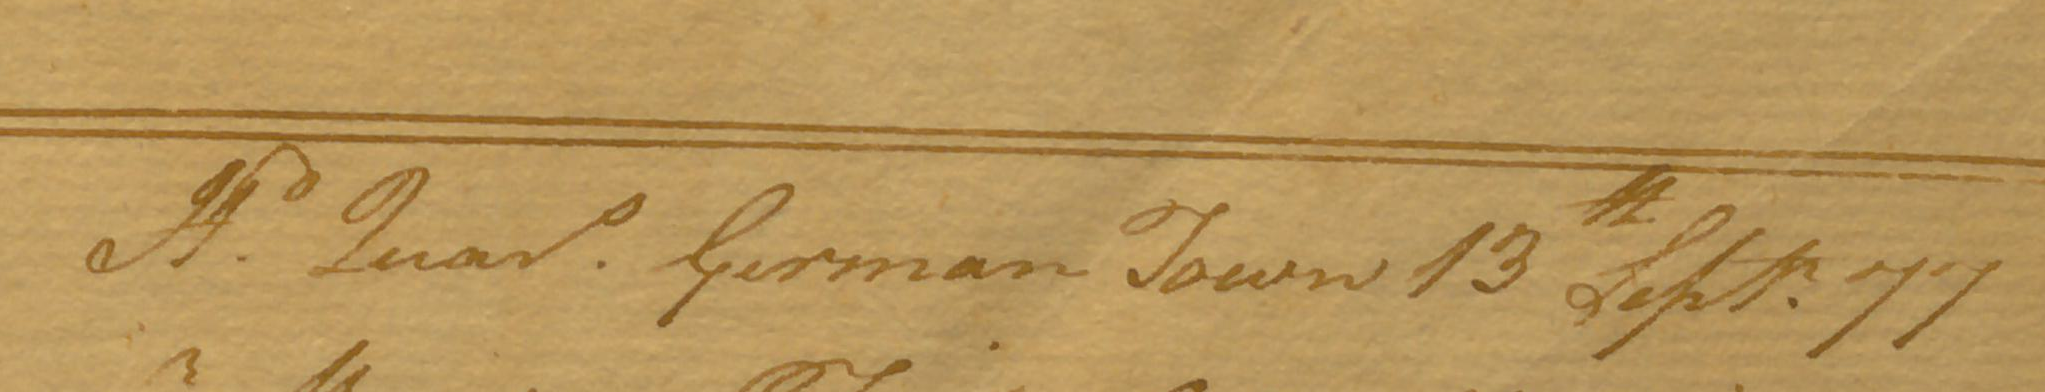H^d. Quar^s. German Town 13^th Sept^r. 77
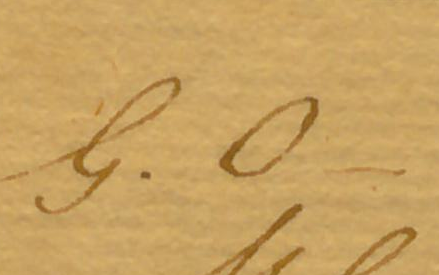G.O-
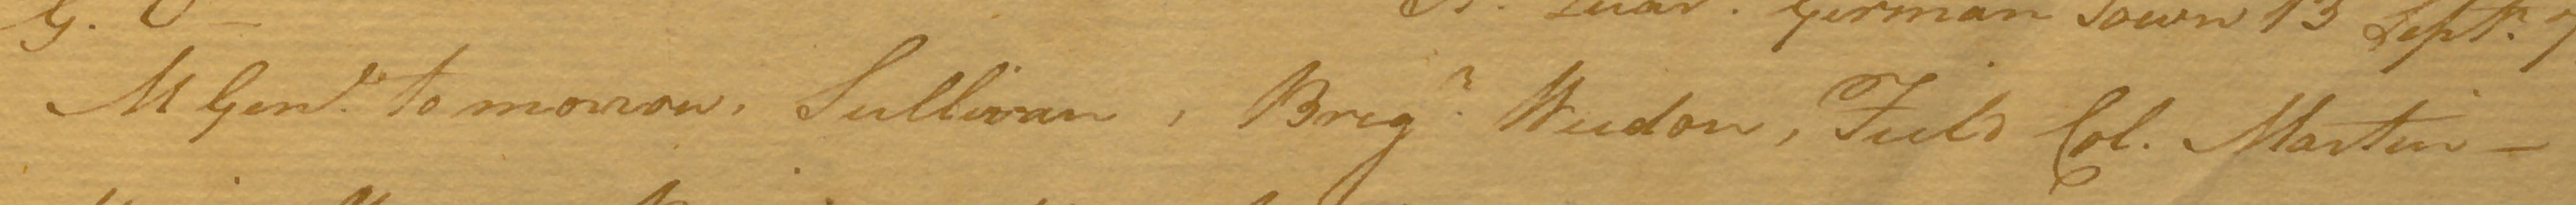M Gen^l. to morrow. Sullivan. Brig^r. Weedon, Field Col. Martin-
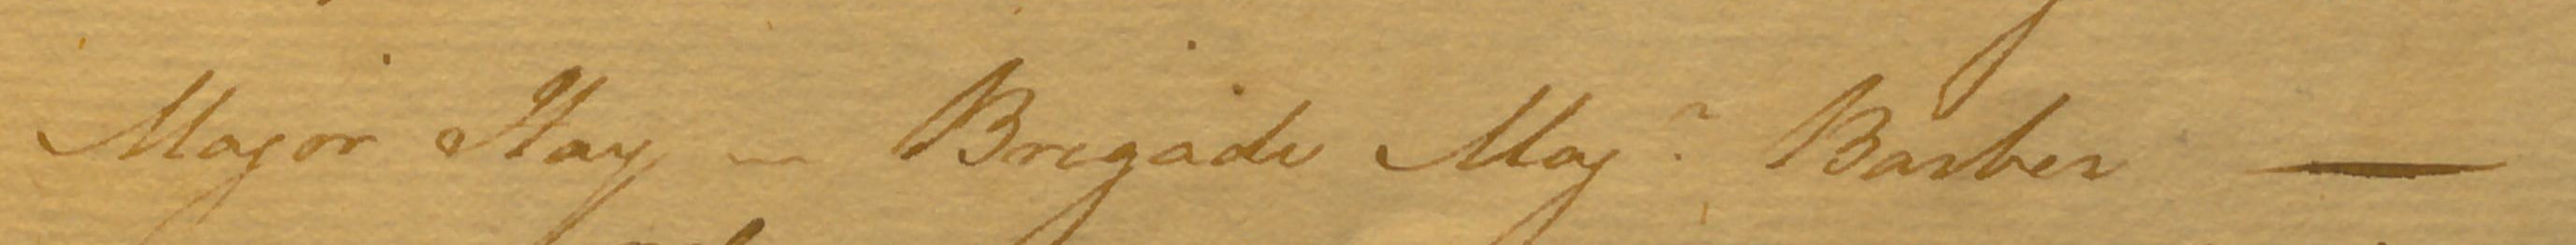Major Hay- Brigade Maj^r. Barber-
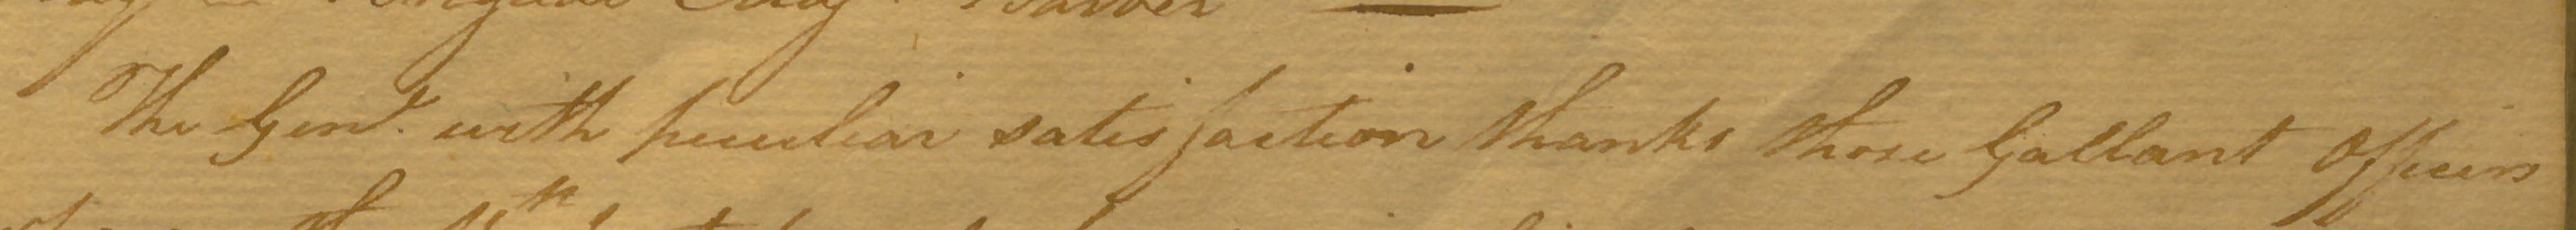The Gen^l. with peculiar satisfaction thanks those Gallant Officers
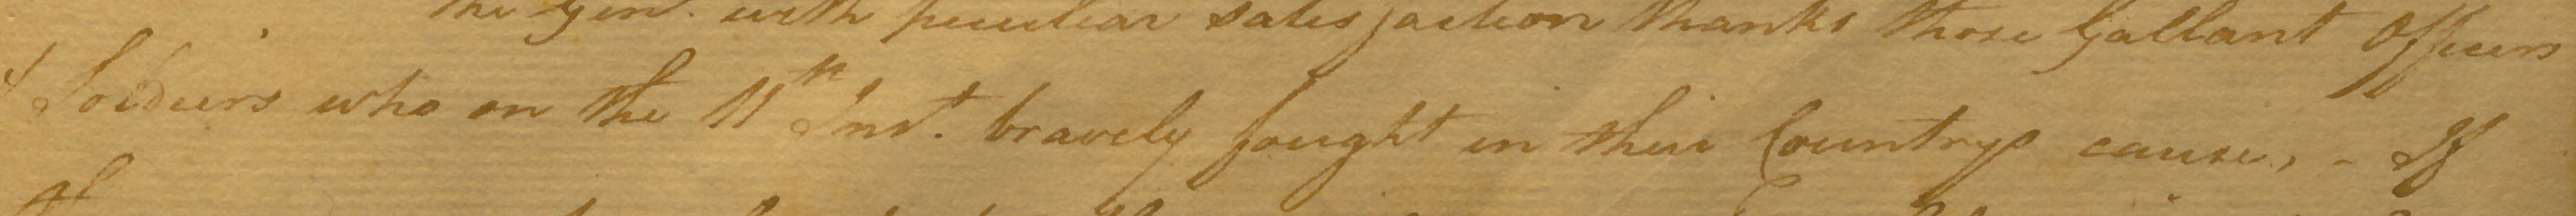& Soldiers who on the 11^th Ins^t. bravely fought in their Countrys cause,- If
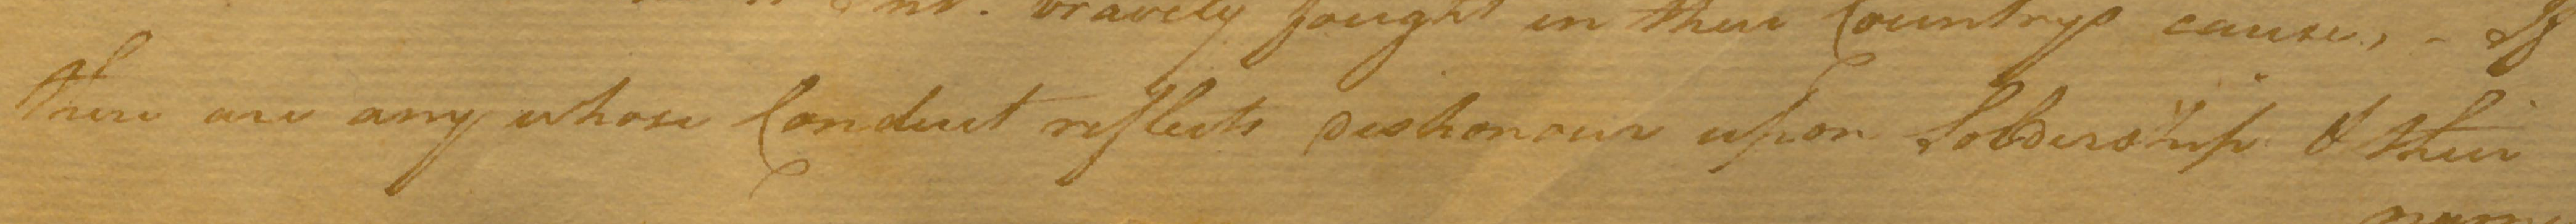there are any whose Conduct reflects dishonour upon Soldership & their
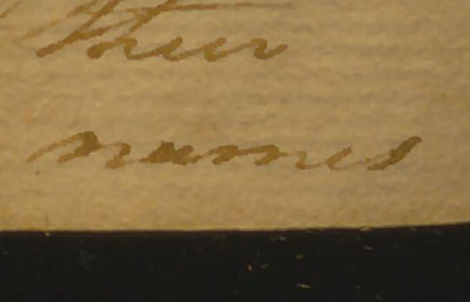names
